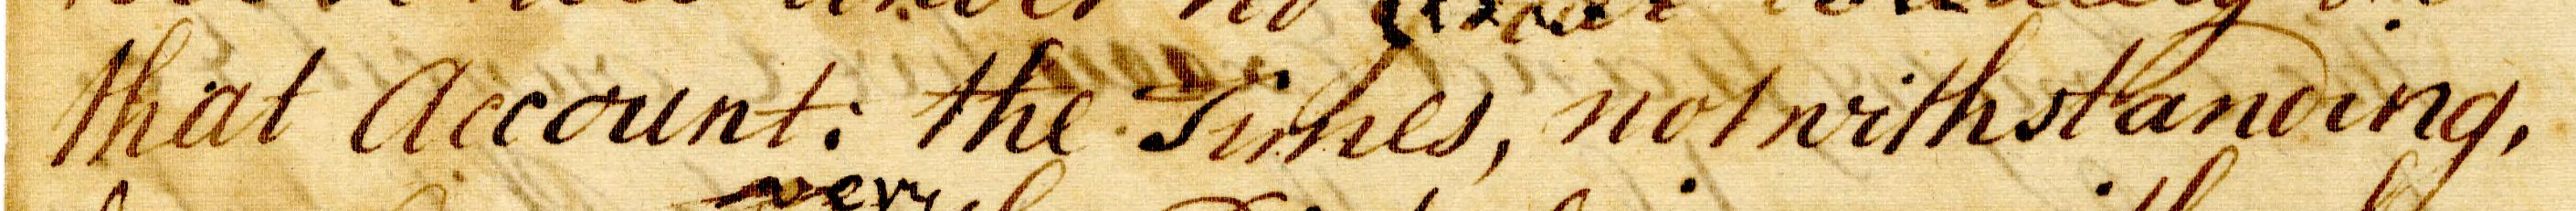that Account: the Times, notwithstanding,
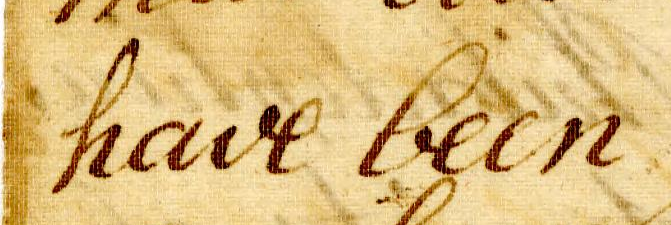have been
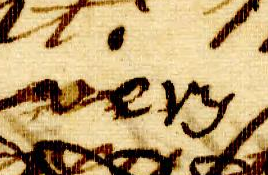very
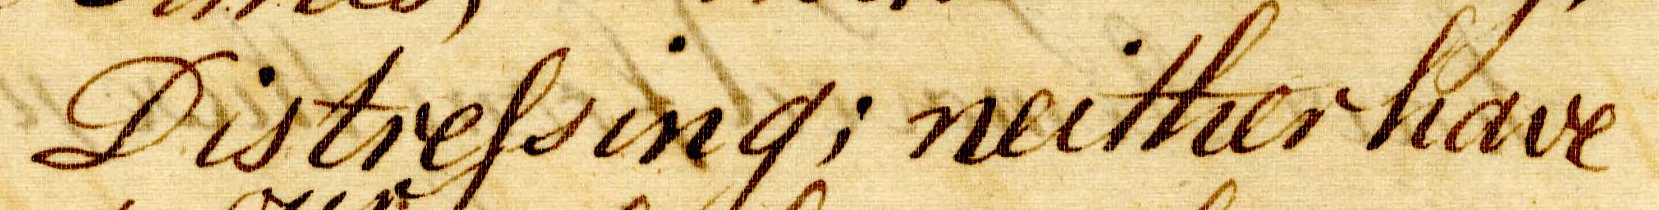Distressing; neither have
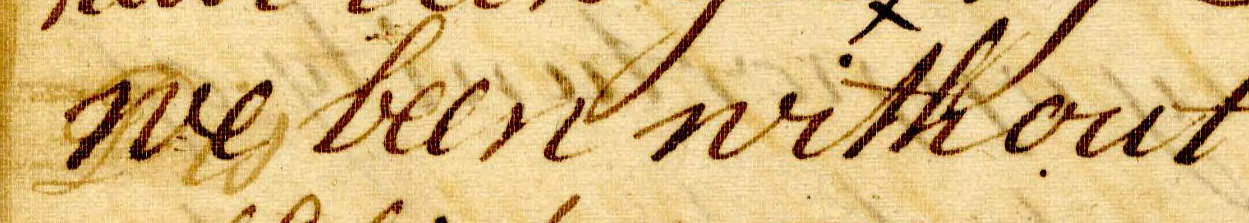me been without
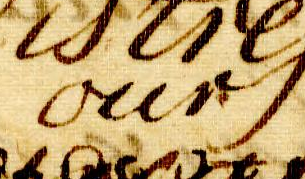our
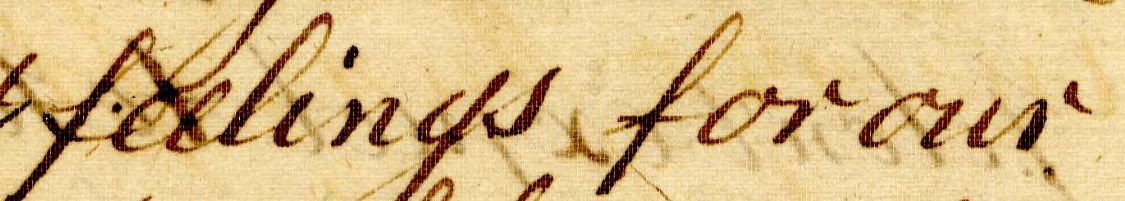feelings for our
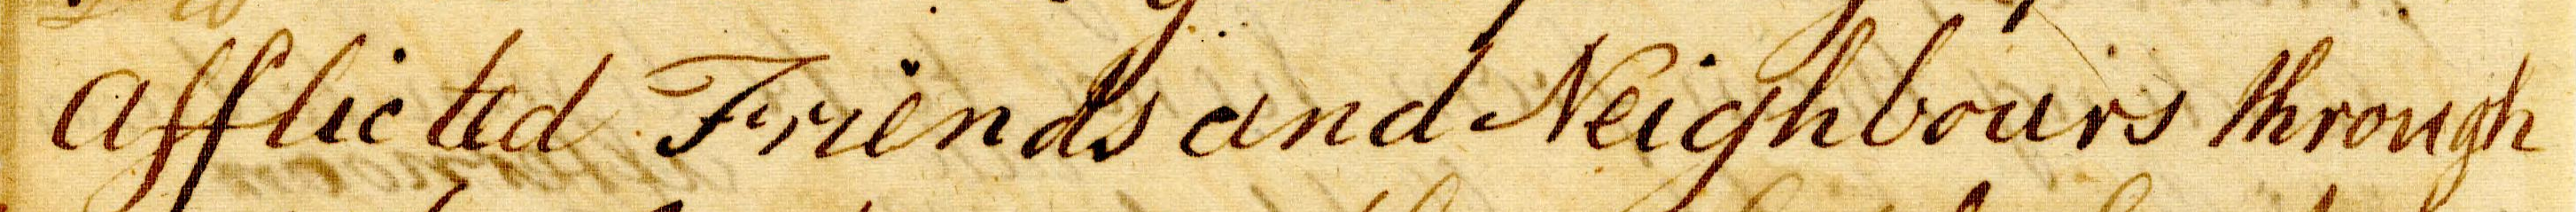Afflicted Friends and Neighbours through
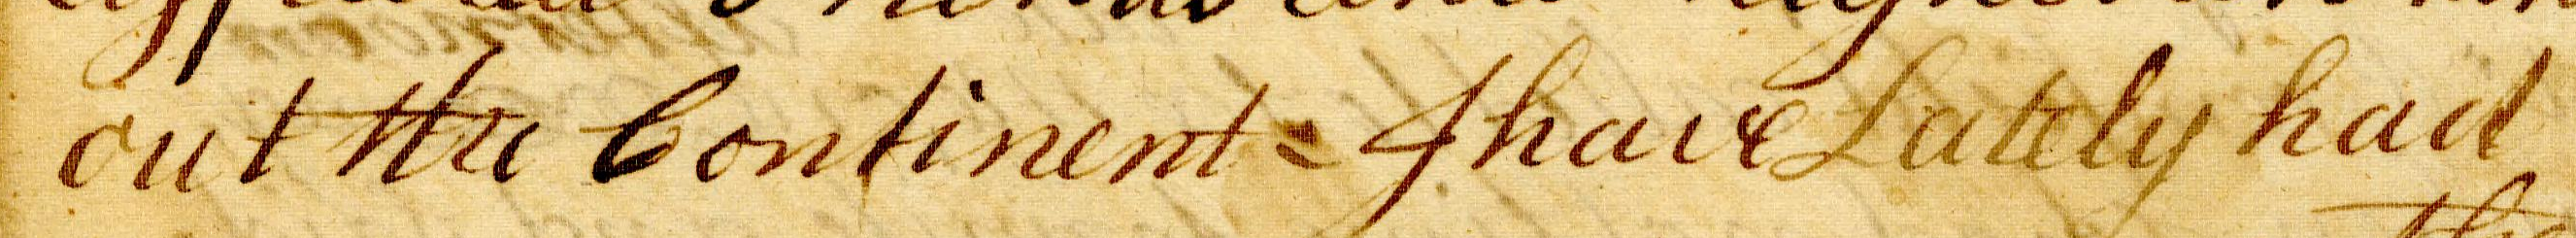out the Continent- I have Lately had
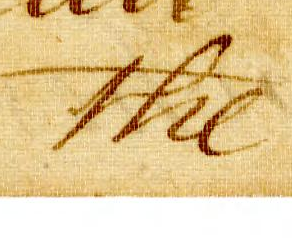the
